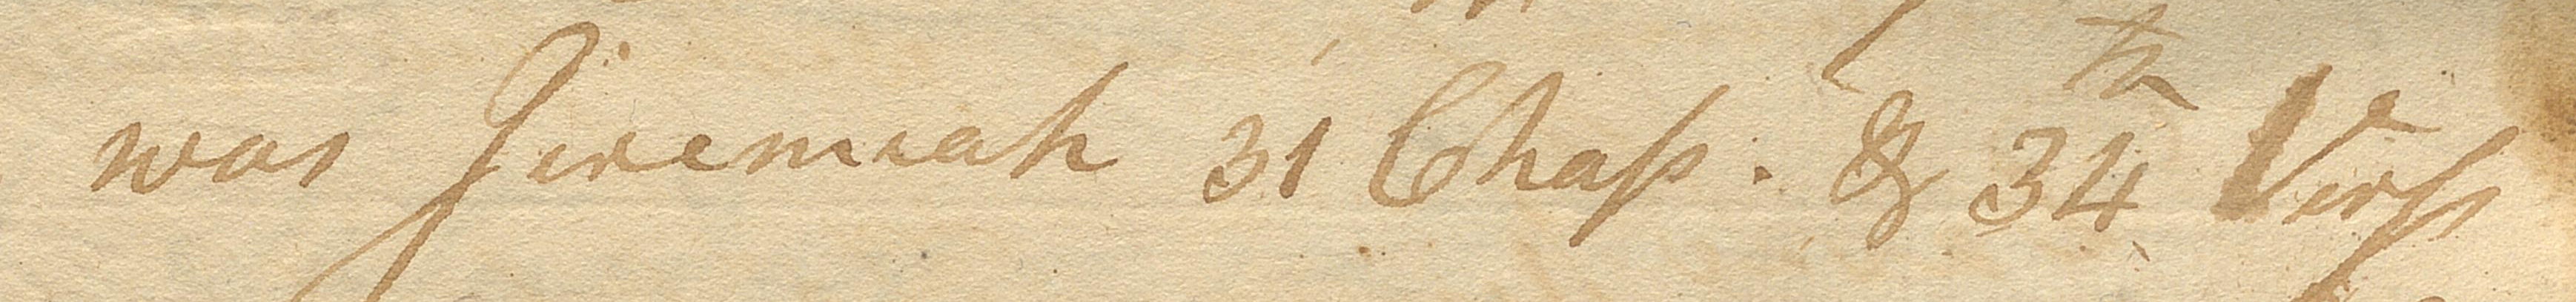was Jeremiah 31 Chap. & 34^th Verss
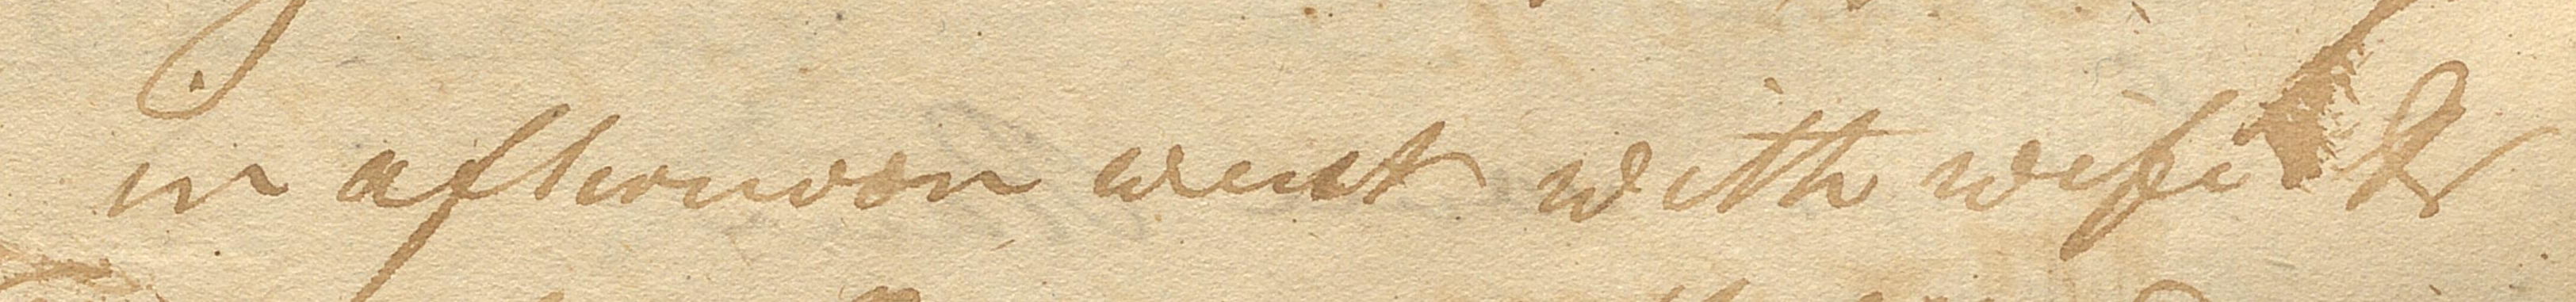in afternoon went with wife &
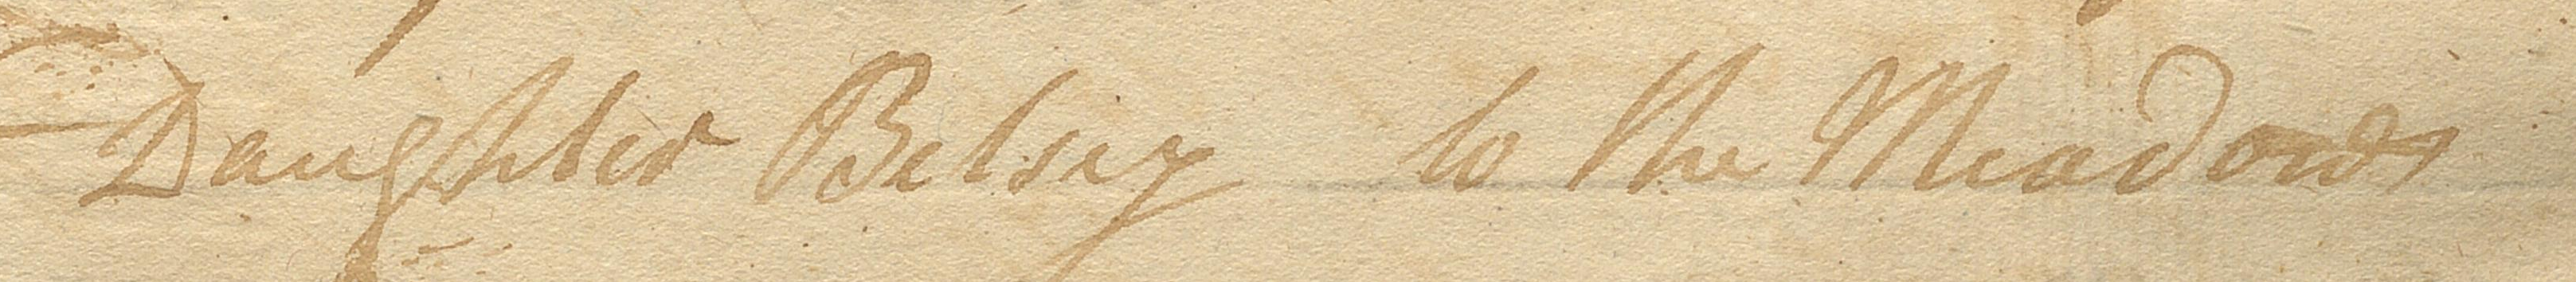Daughter Betsey to the Meadows
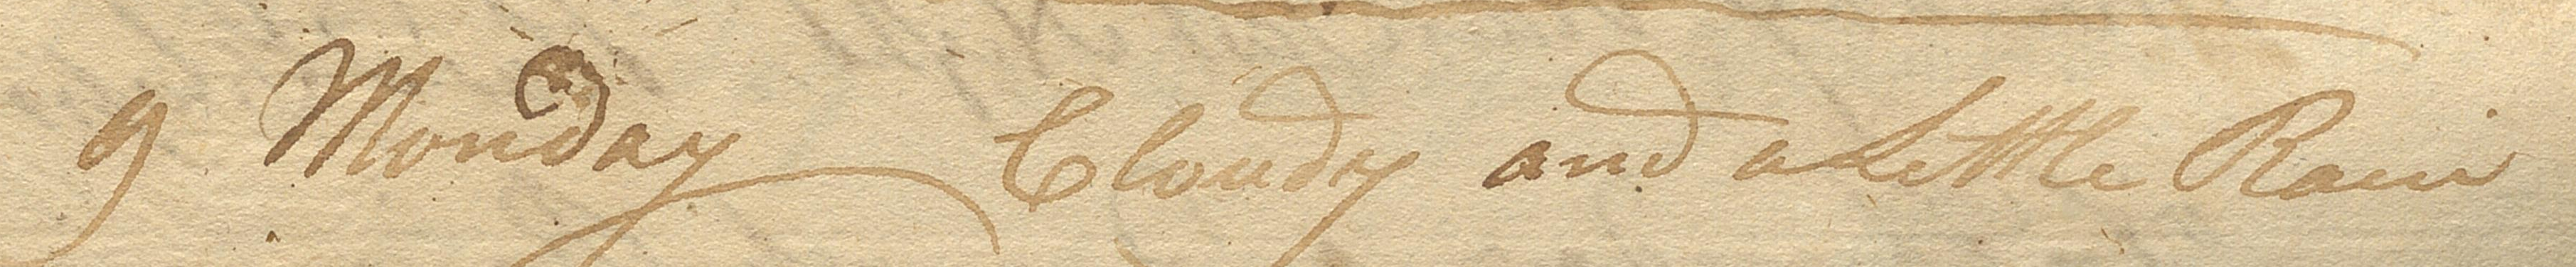9 Monday Cloudy and a Little Rain
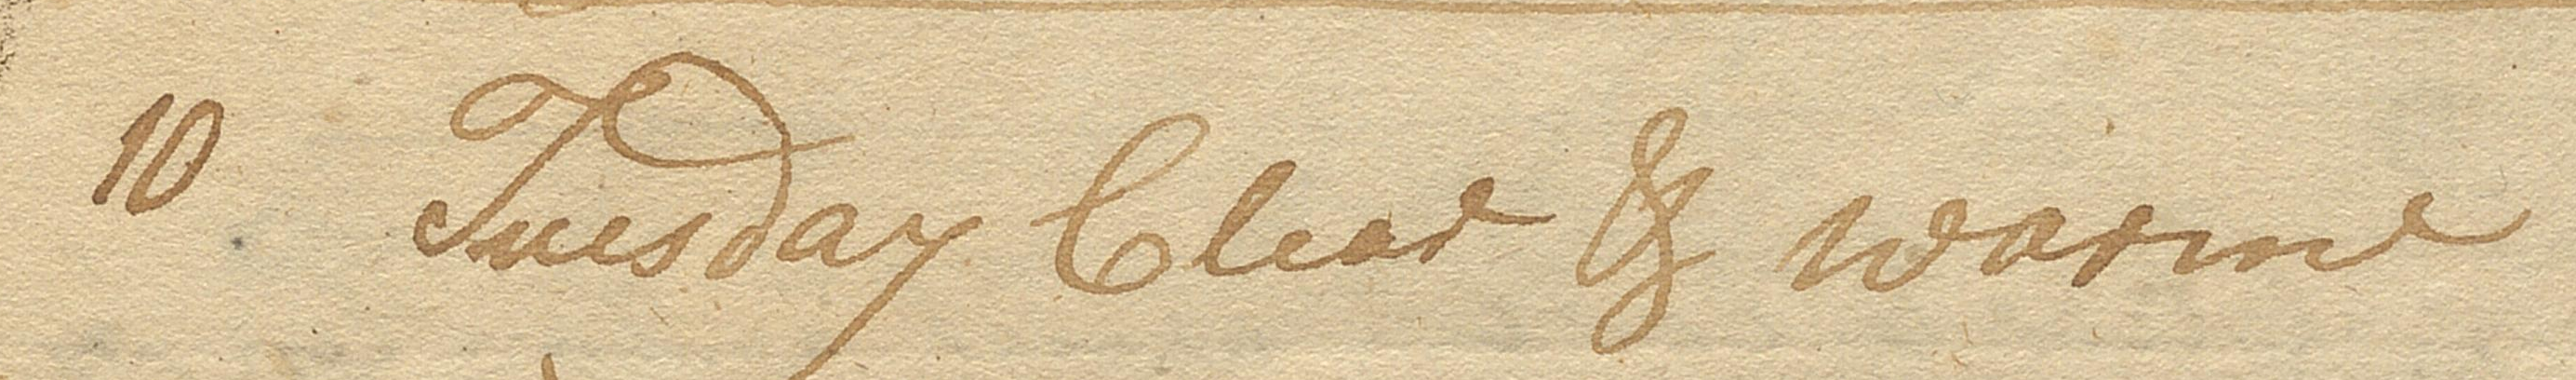10. Tuesday Clear & warme
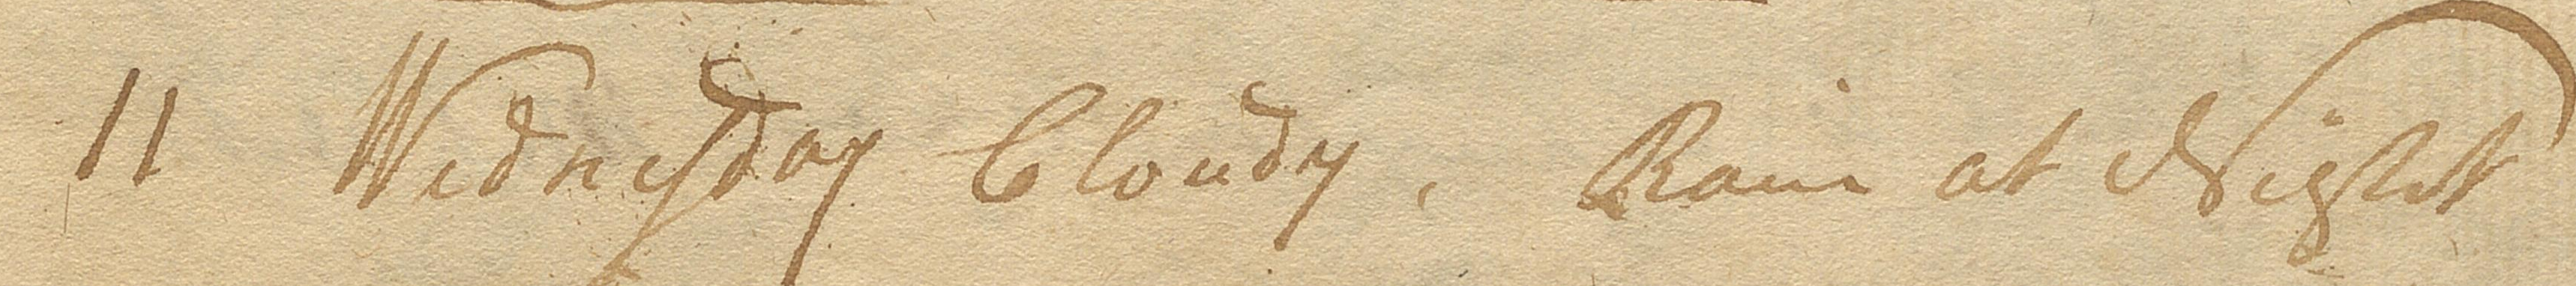11 Wednesday Cloudy. Rain at Night
